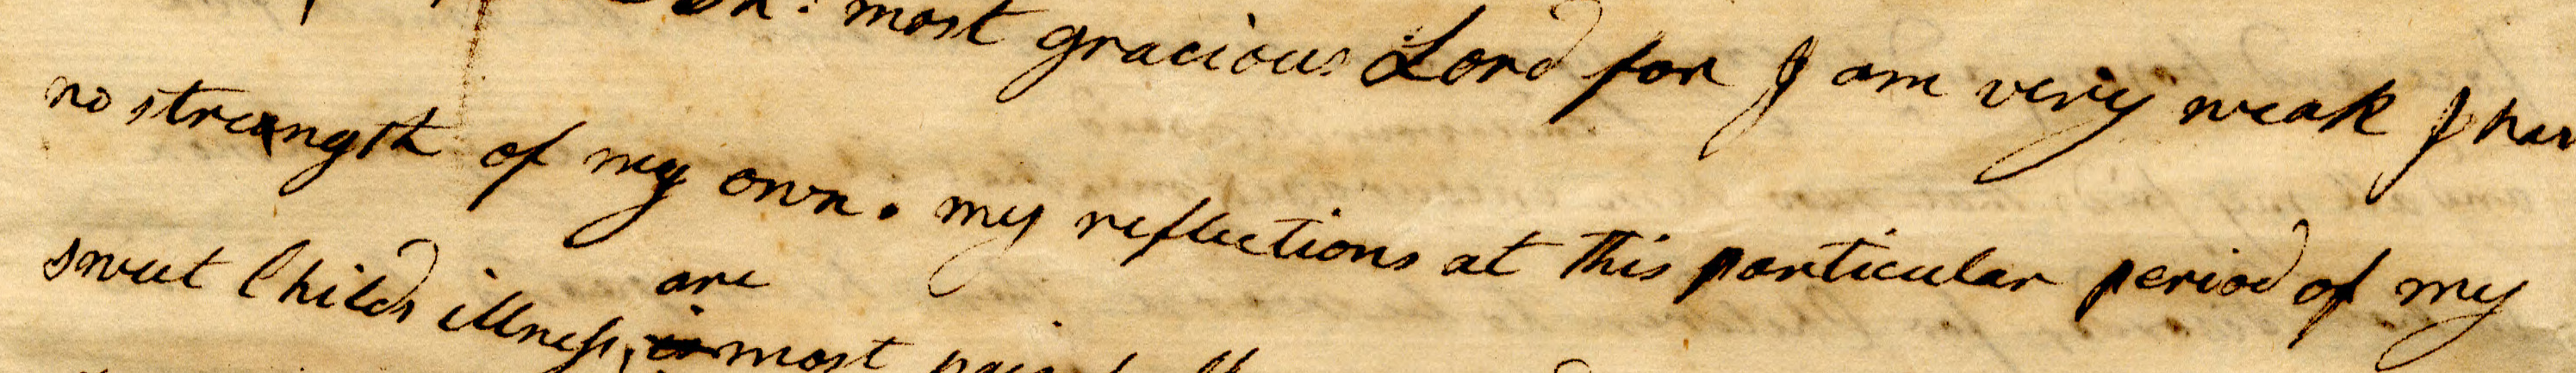no strength of my own. my reflections at this particular period of my
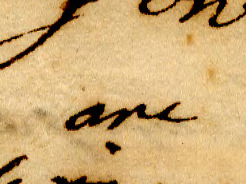are
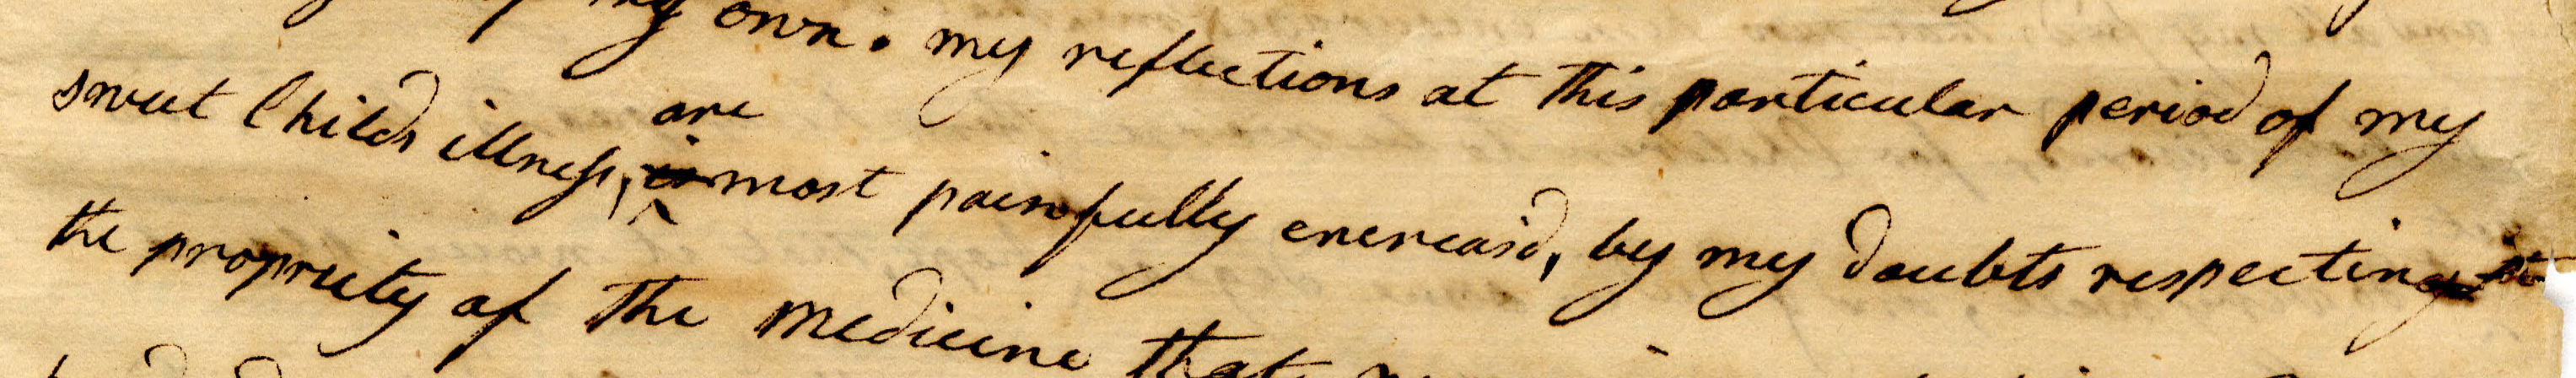sweet Childs illness ^ most painfully encreas'd, by my doubts respecting
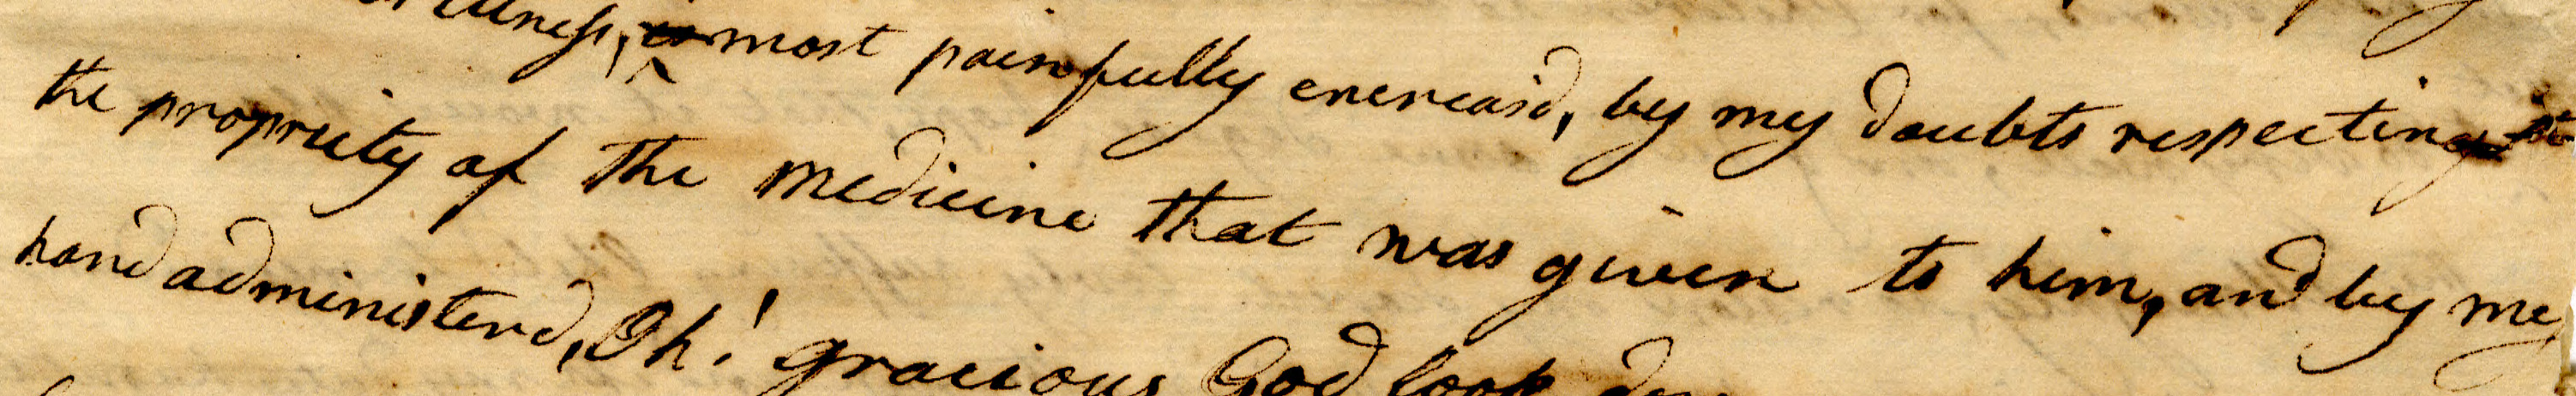the propriety of the medicine that was given to him, and by my
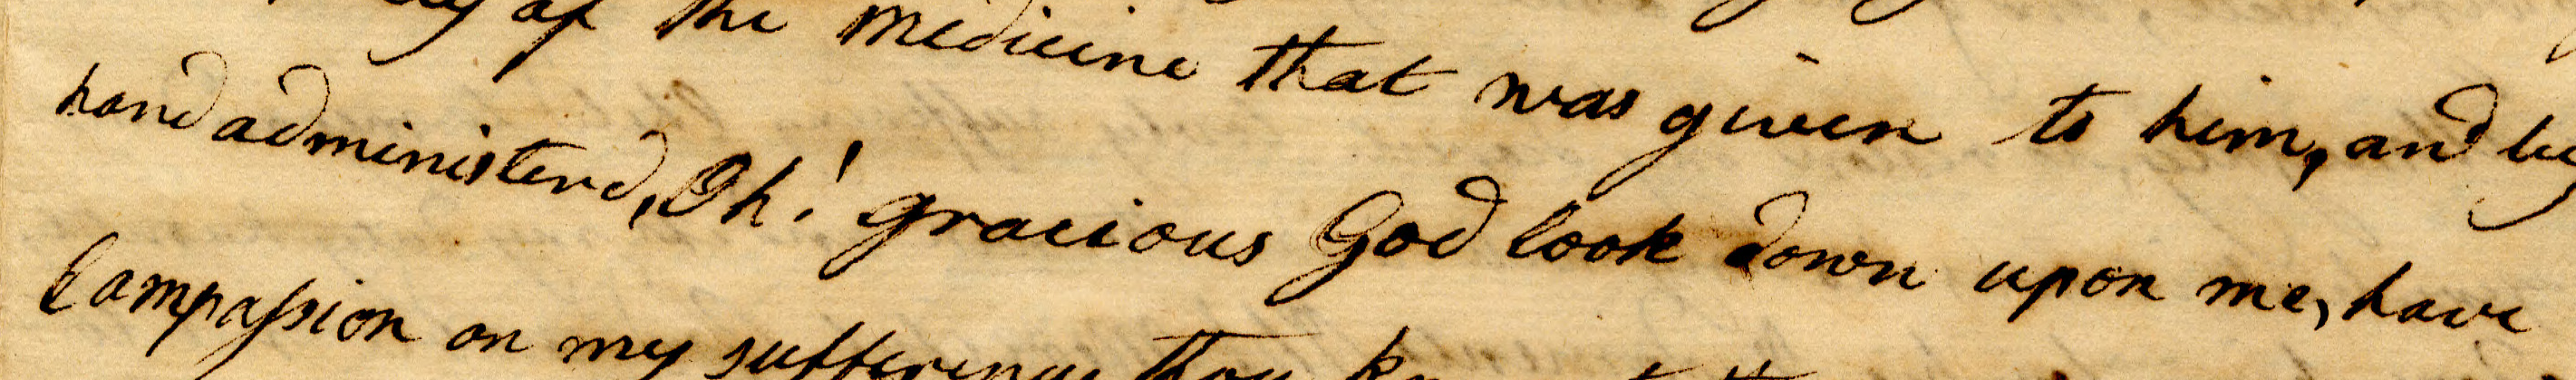hand administerd, Oh! gracious God look down upon me, have
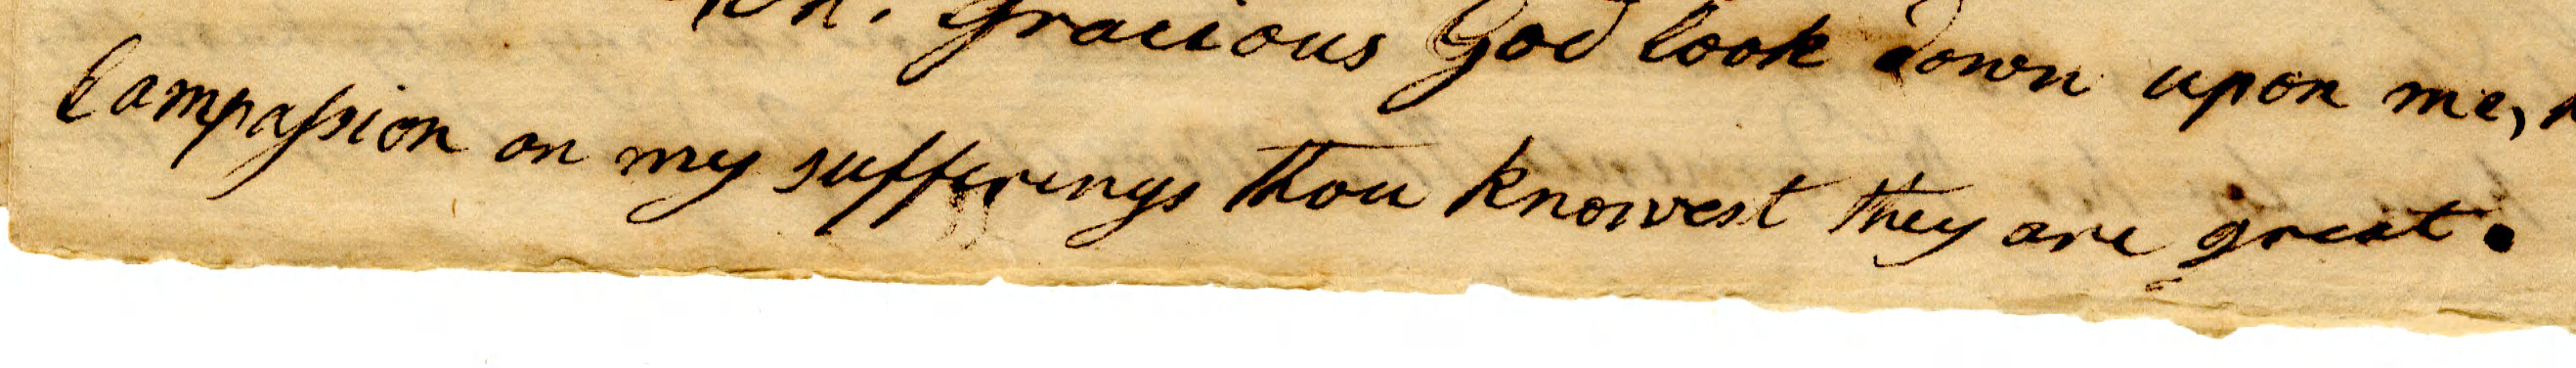Campassion on my sufferings thou knowest they are great.
